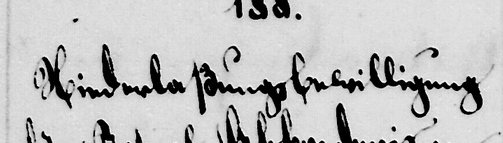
Niederlaßung in ihren
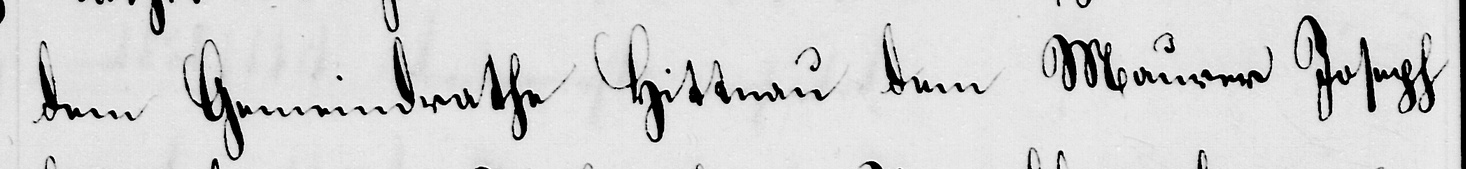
dem Gemeindrathe Hittnau dem Maurer Joseph
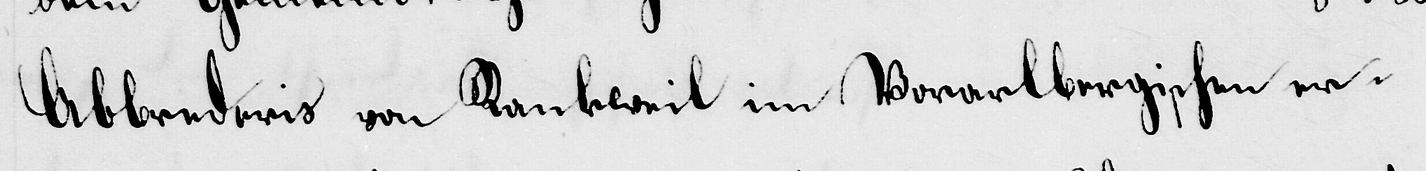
Abbrederis von Rankweil im Vorarlbergischen er¬
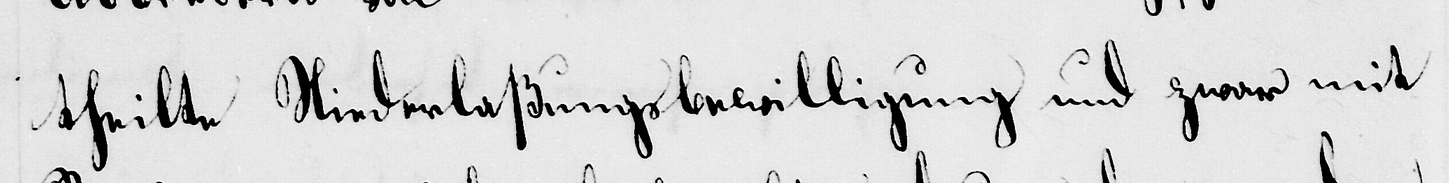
theilte Niederlaßungsbewilligung und zwar mit
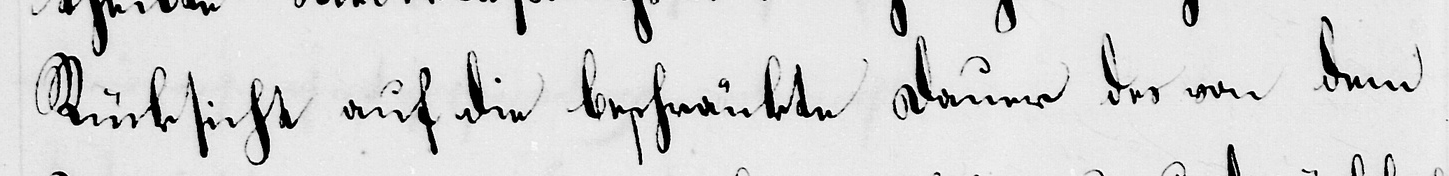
Rücksicht auf die beschränkte Dauer des von dem
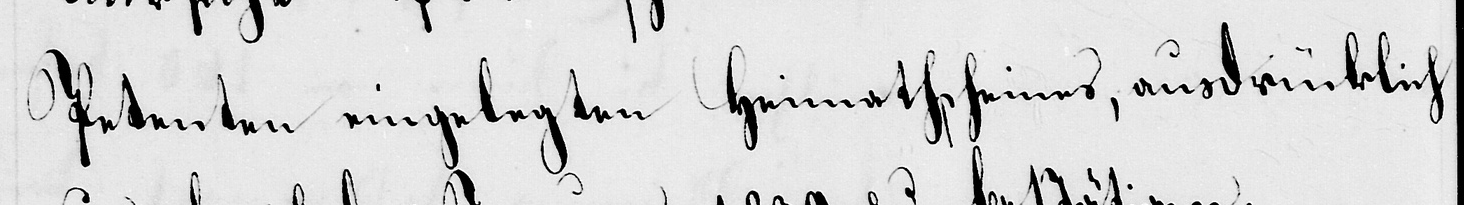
Petenten eingelegten Heimathscheines, ausdrücklich
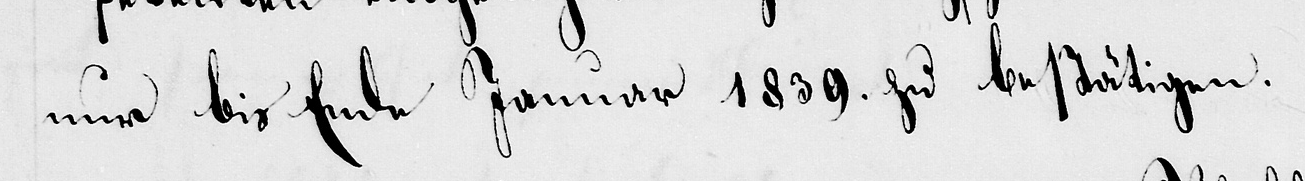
nur bis Ende Januar 1839. zu bestätigen.
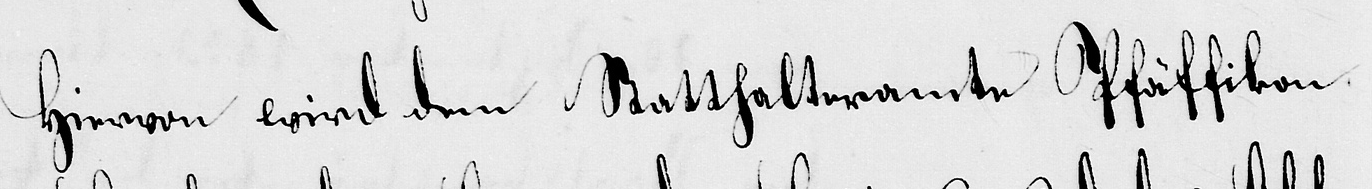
Hiervon wird dem Statthalteramte Pfäffikon
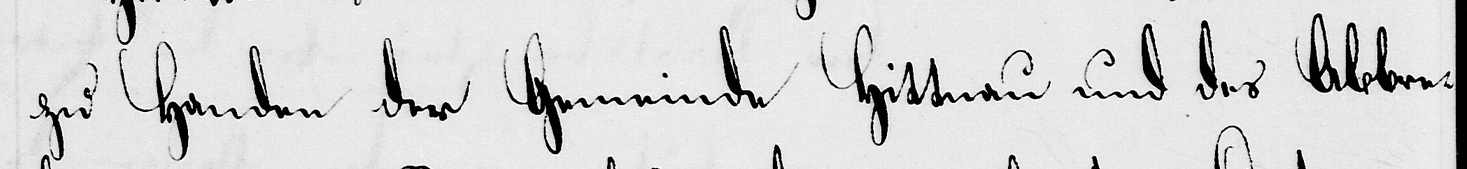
zu Handen der Gemeinde Hittnau und des Abbre¬
